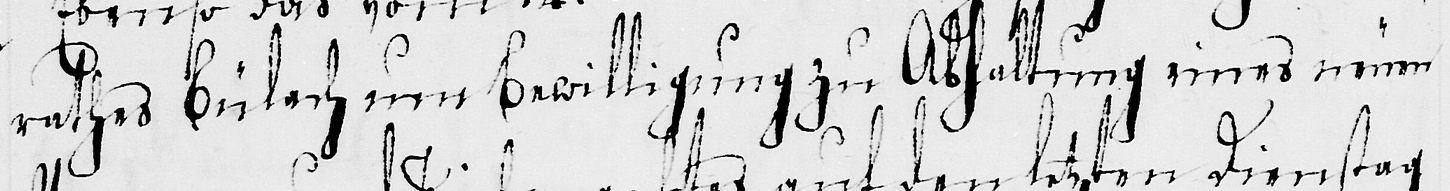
rathes Bülach um Bewilligung zu Abhaltung eines neuen
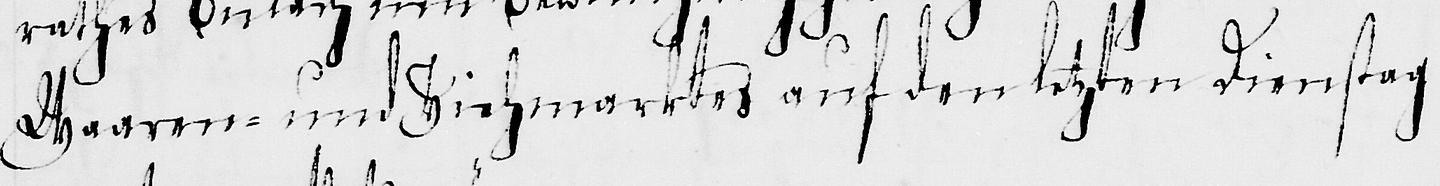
Waaren- und Viehmarktes auf den letzten Dienstag
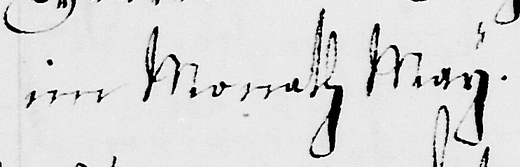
im Monath May.
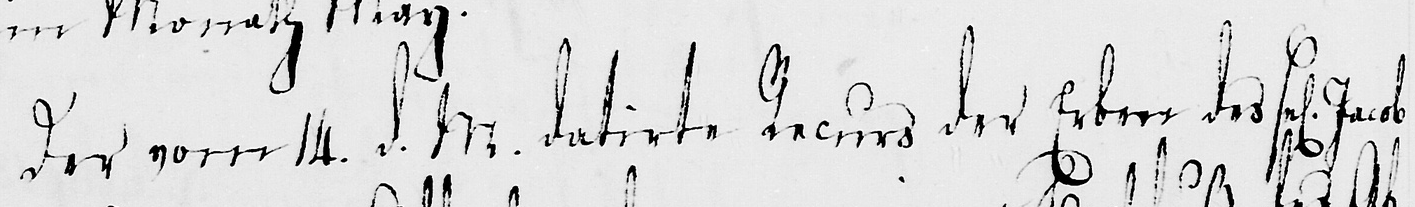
Der vom 14. d. M. datirte Recurs der Erben des se¬
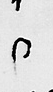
l.
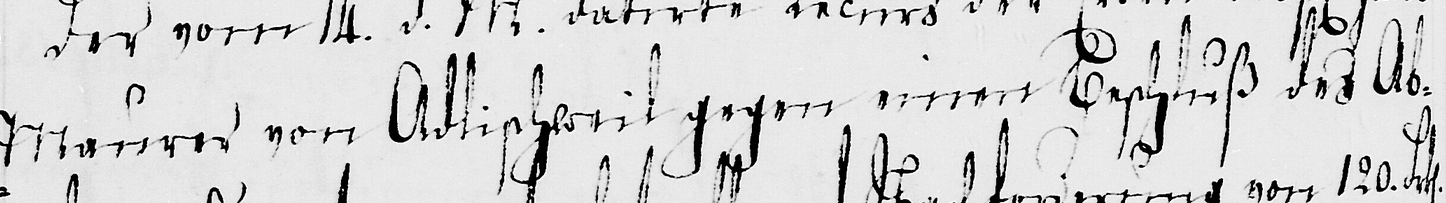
Maurer von Adlischweil gegen einen Beschluß des Ab¬
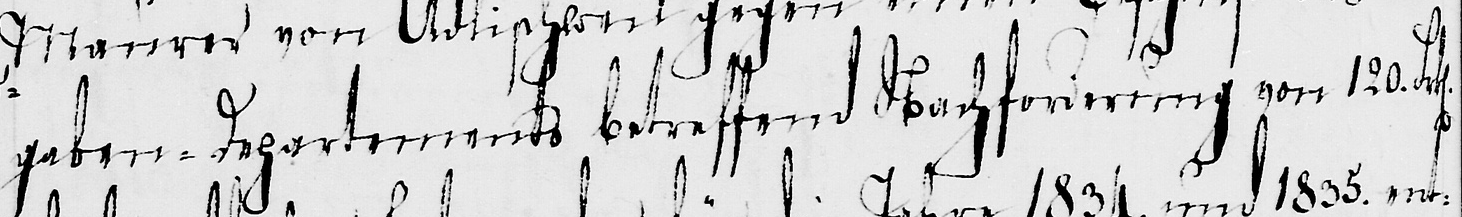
gaben-Departements betreffend Nachforderung von 120.
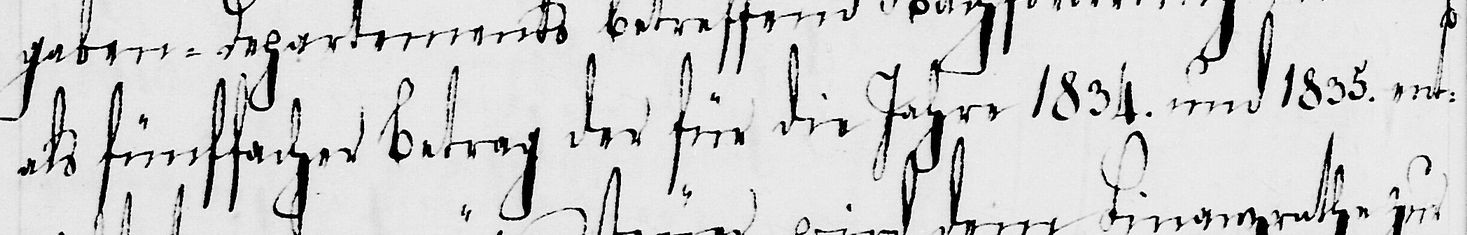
als fünffacher Betrag der für die Jahre 1834. und 1835. en¬
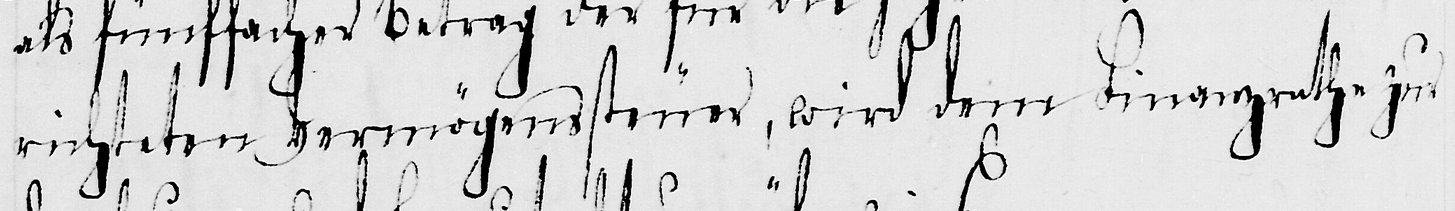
trichteten Vermögenssteuer, wird dem Finanzrathe zur
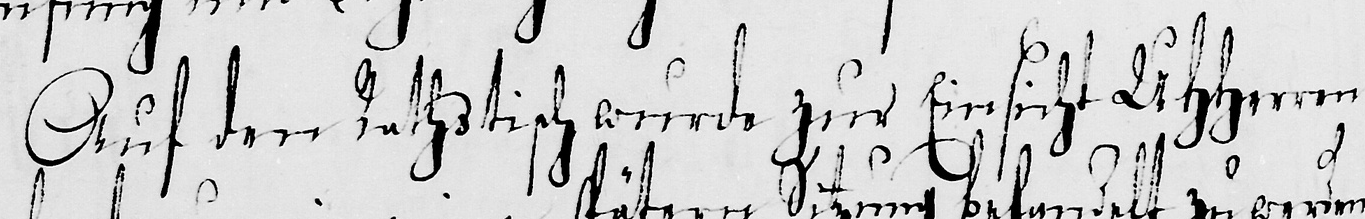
Auf den Rathstisch wurde zur Einsicht UHHerr¬
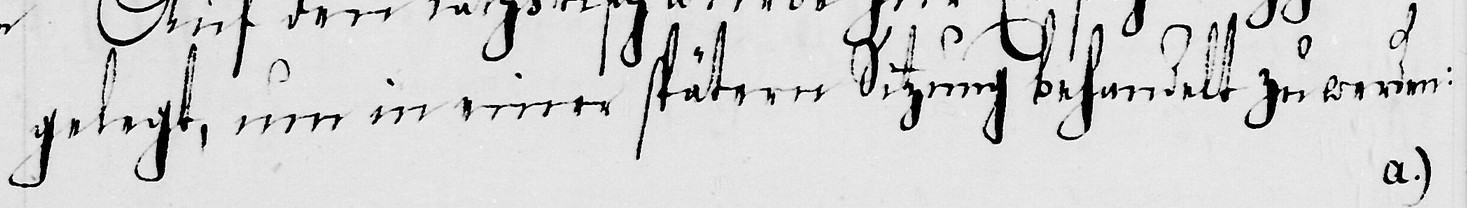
gelegt, um in einer spätern Sitzung behandelt zu werden:
